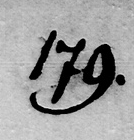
1833.
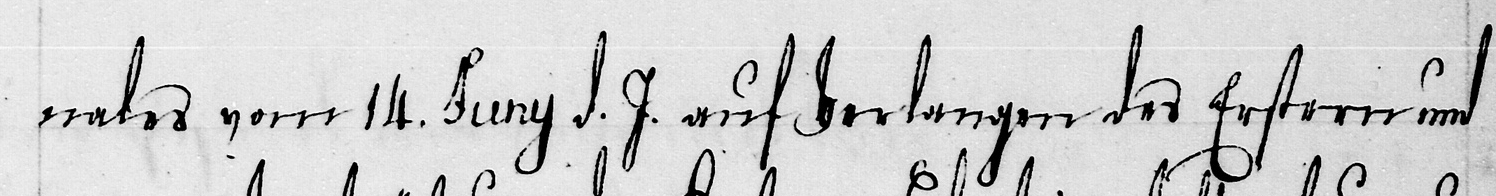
nales vom 14 .Juny d. J. auf Verlangen des Erstern und
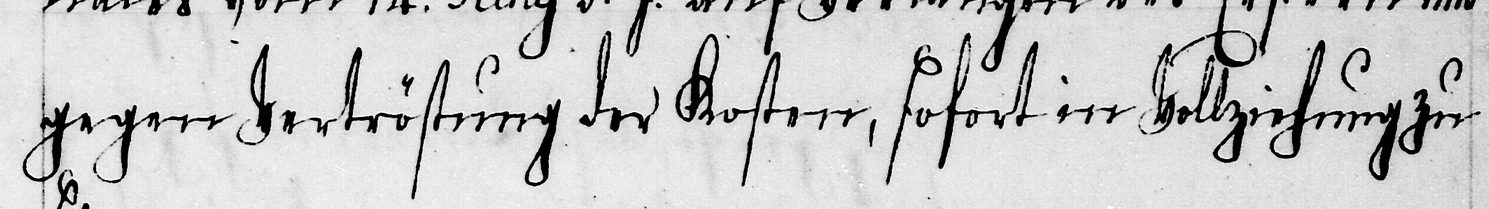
gegen Vertröstung der Kosten, sofort in Vollziehung zu
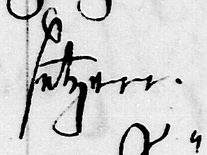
setzen.
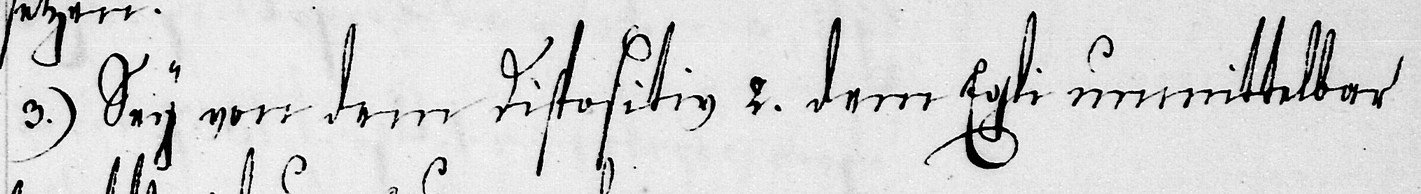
3.) Sey von dem Dispositiv 2. dem Egli unmittelbar
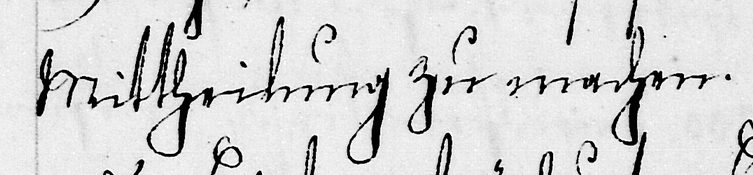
Mittheilung zu machen.
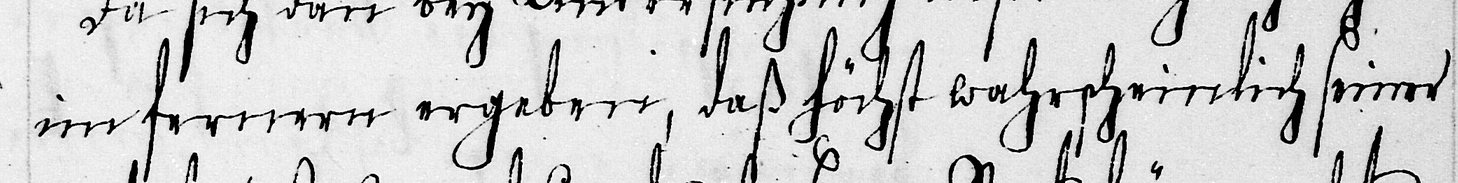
im fernern ergeben, daß höchst wahrscheinlich seiner
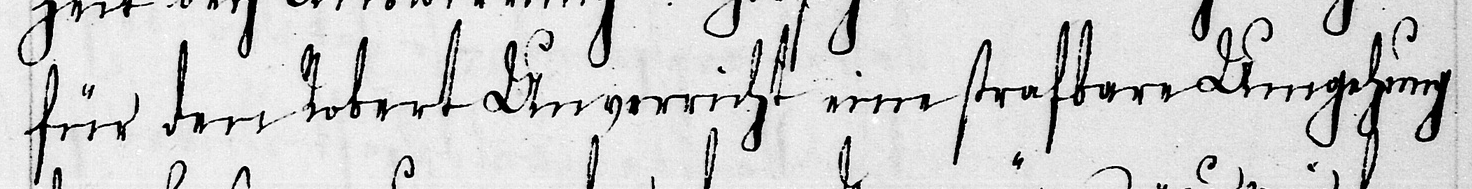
für den Robert Unverricht eine strafbare Umgebung
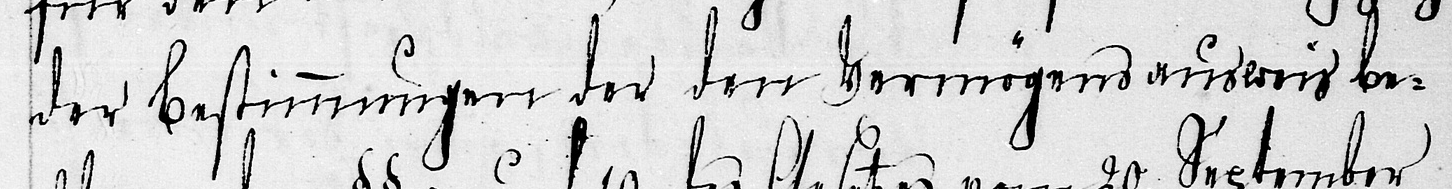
der Bestimmungen der den Vermögensausweis be¬
